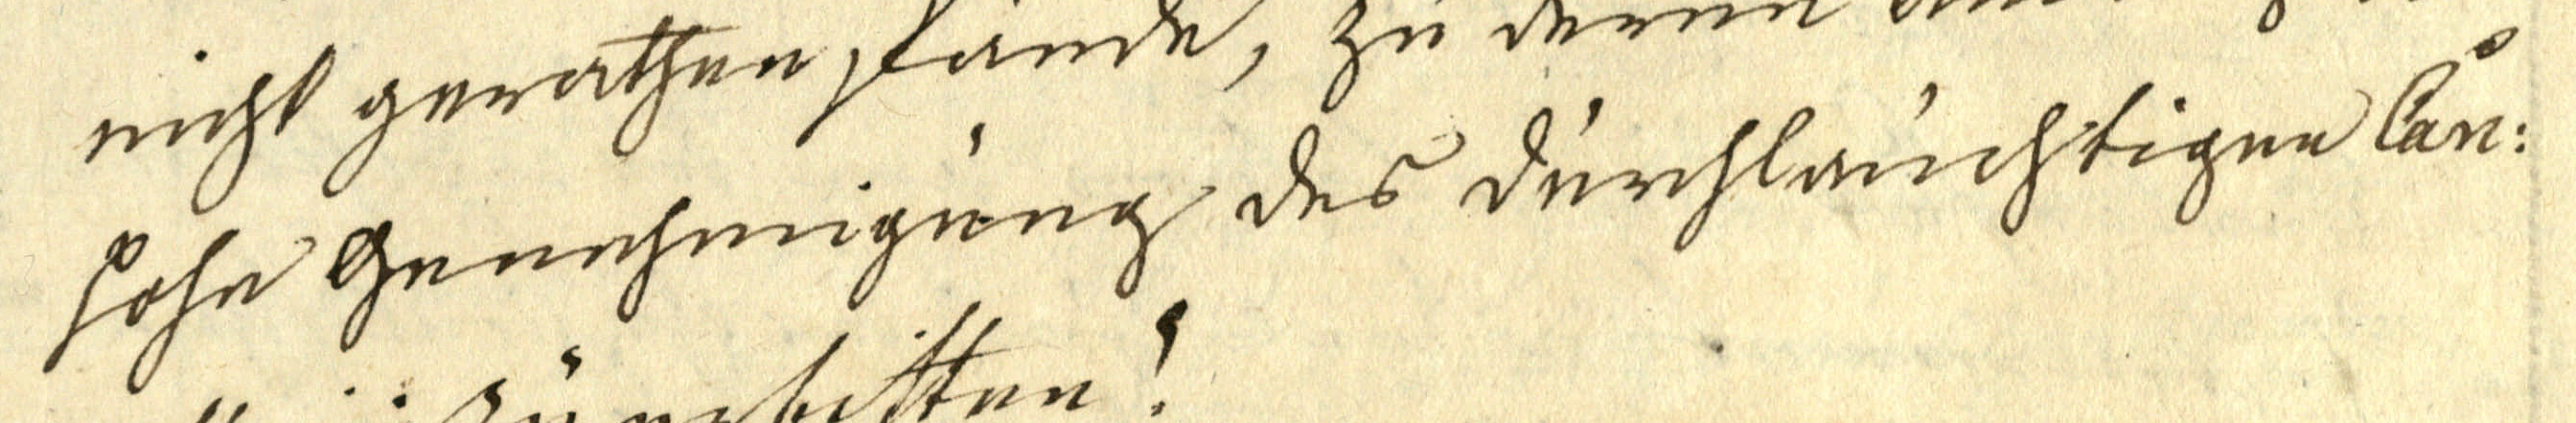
hohe Genehmigung des durchlauchtigen Can¬
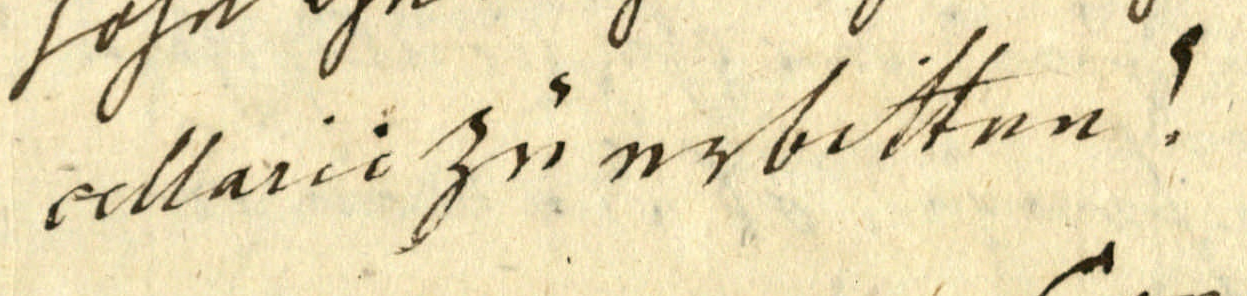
cellarii zu erbitten?
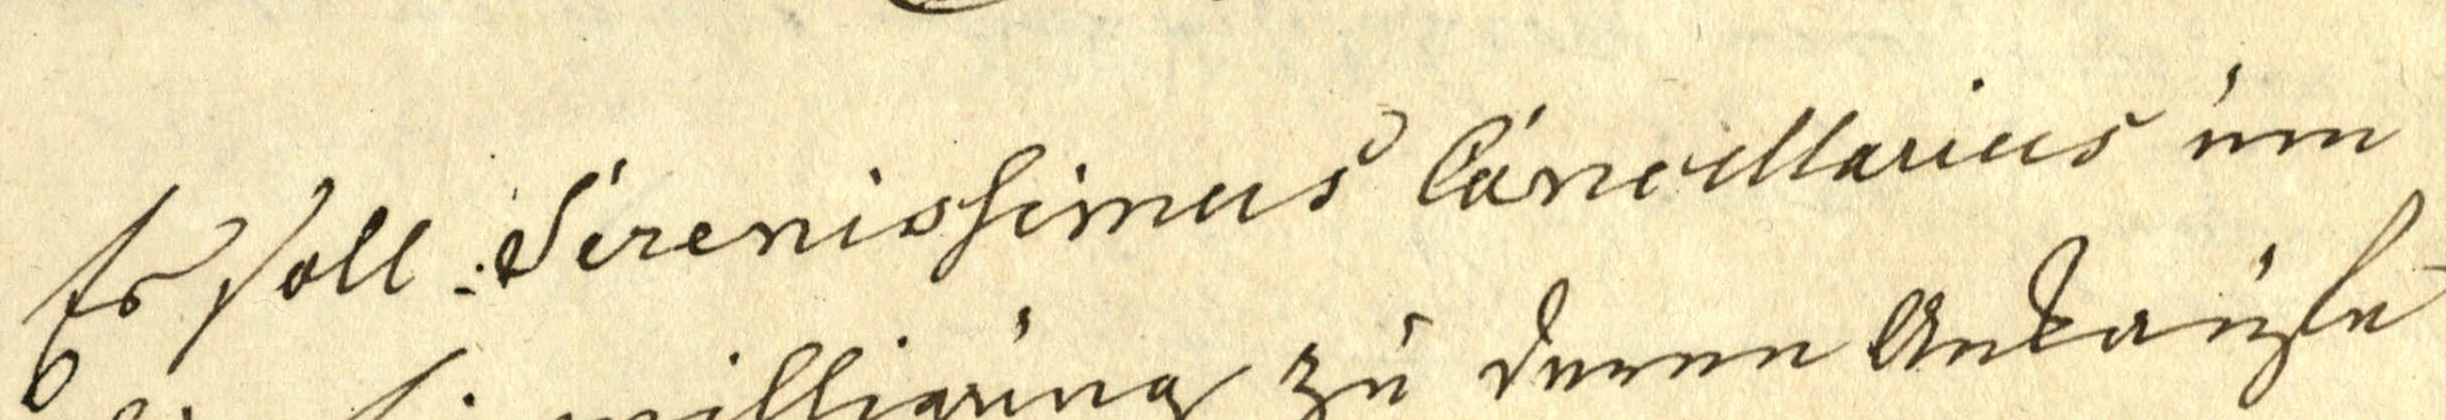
Es soll Serenissimus Cancellarius um
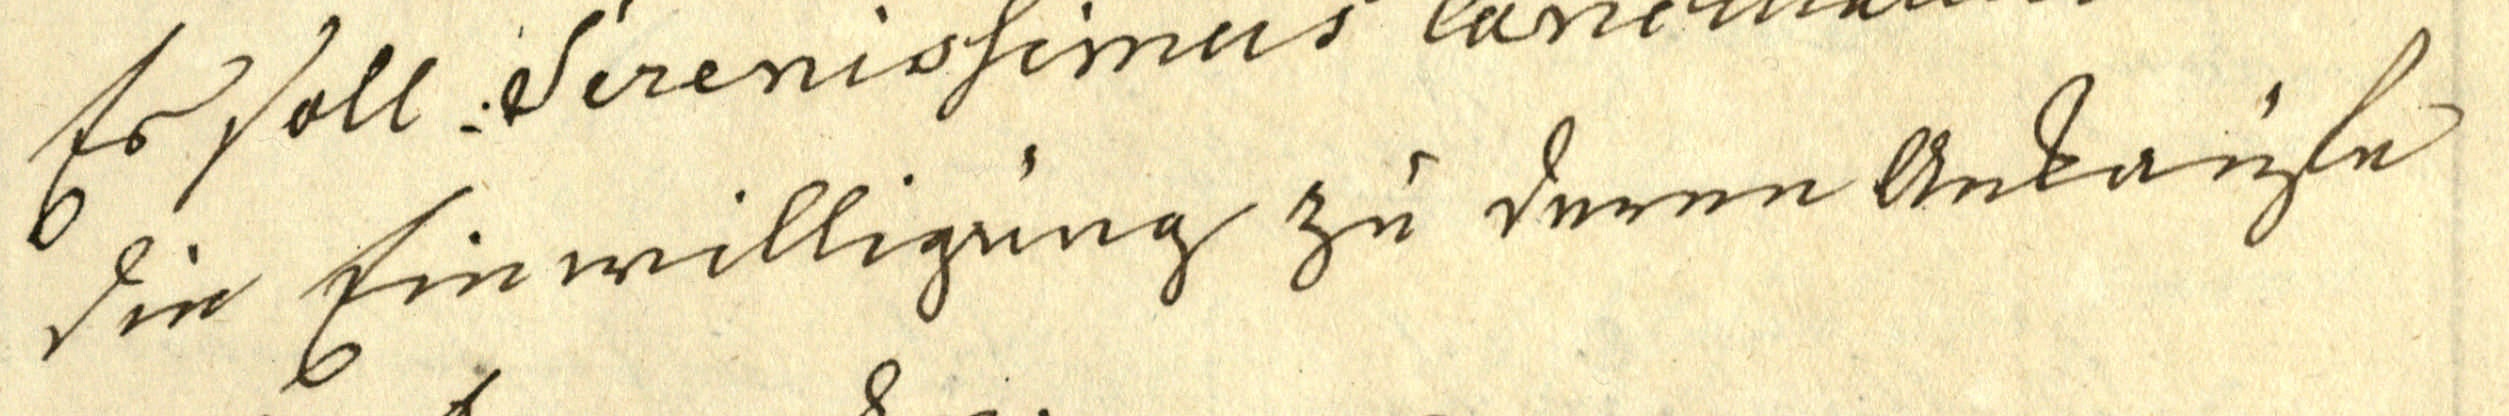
die Einwilligung zu deren Ankauf
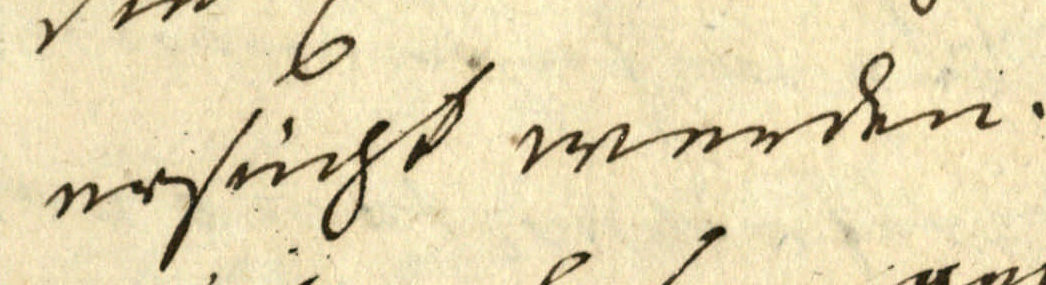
ersucht werden.
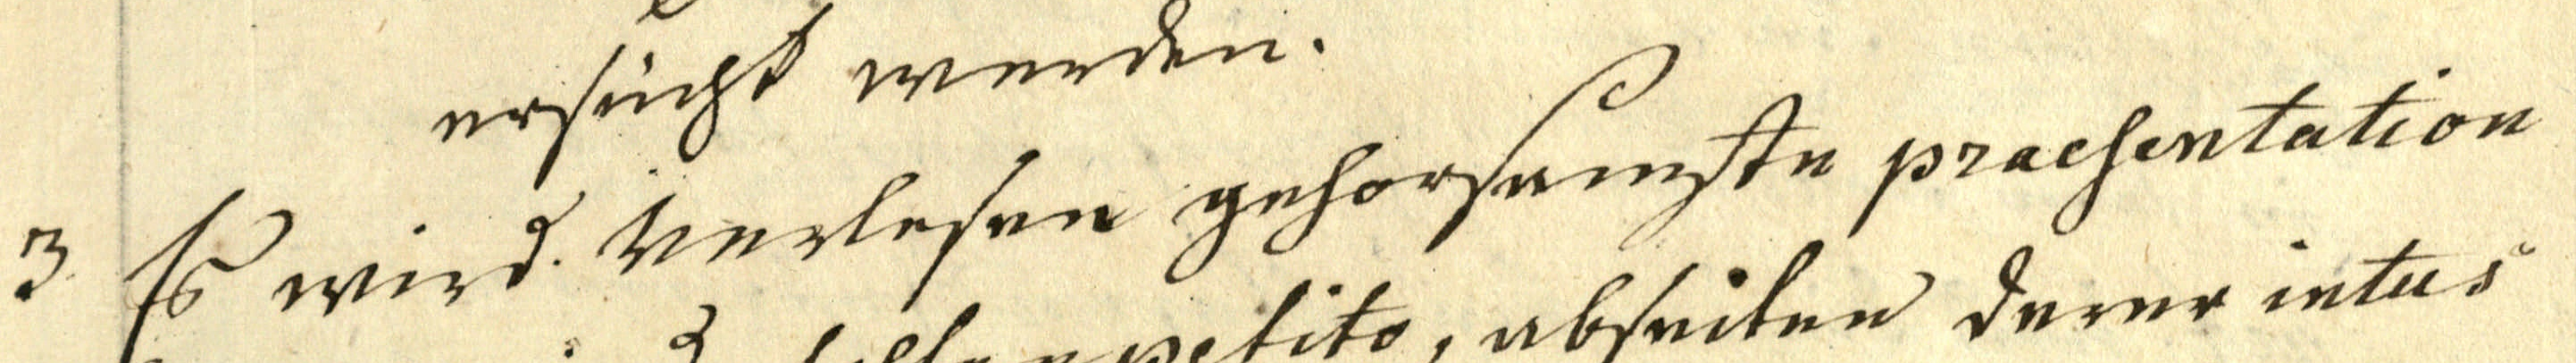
3. Es wird. verlesen gehorsamste praesentation
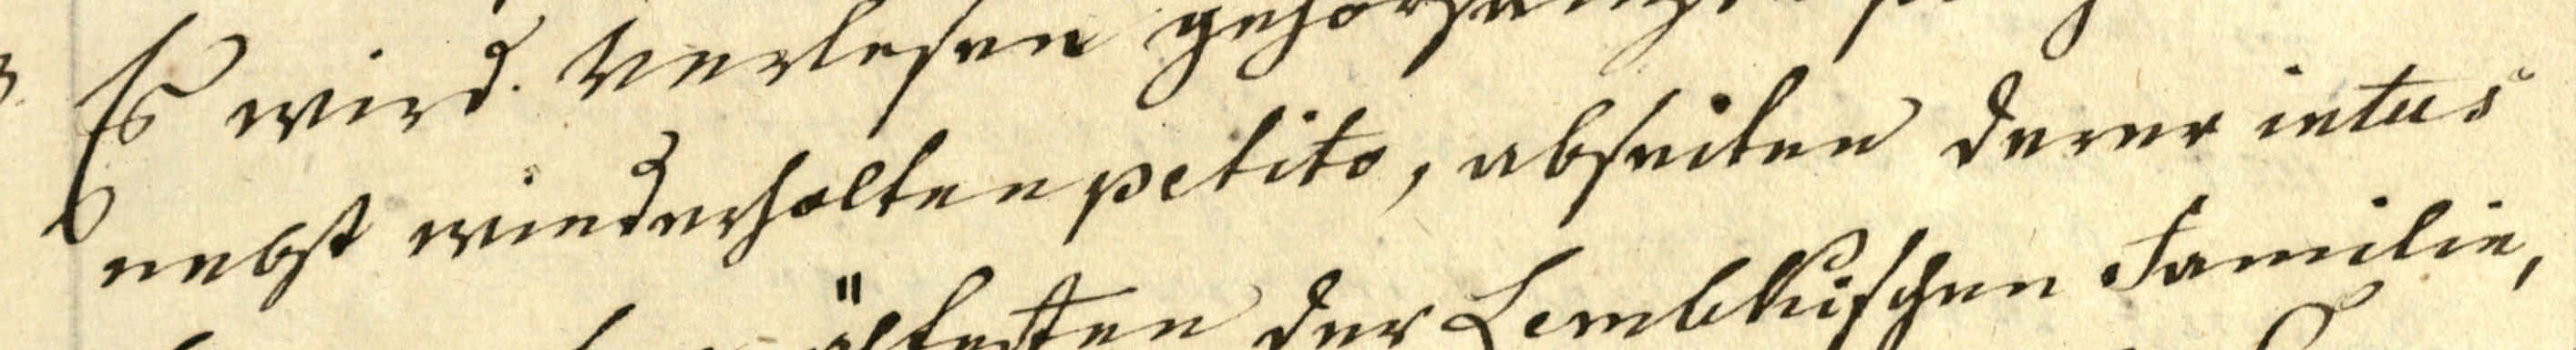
nebst wiederholte petito, abseiten derer intus
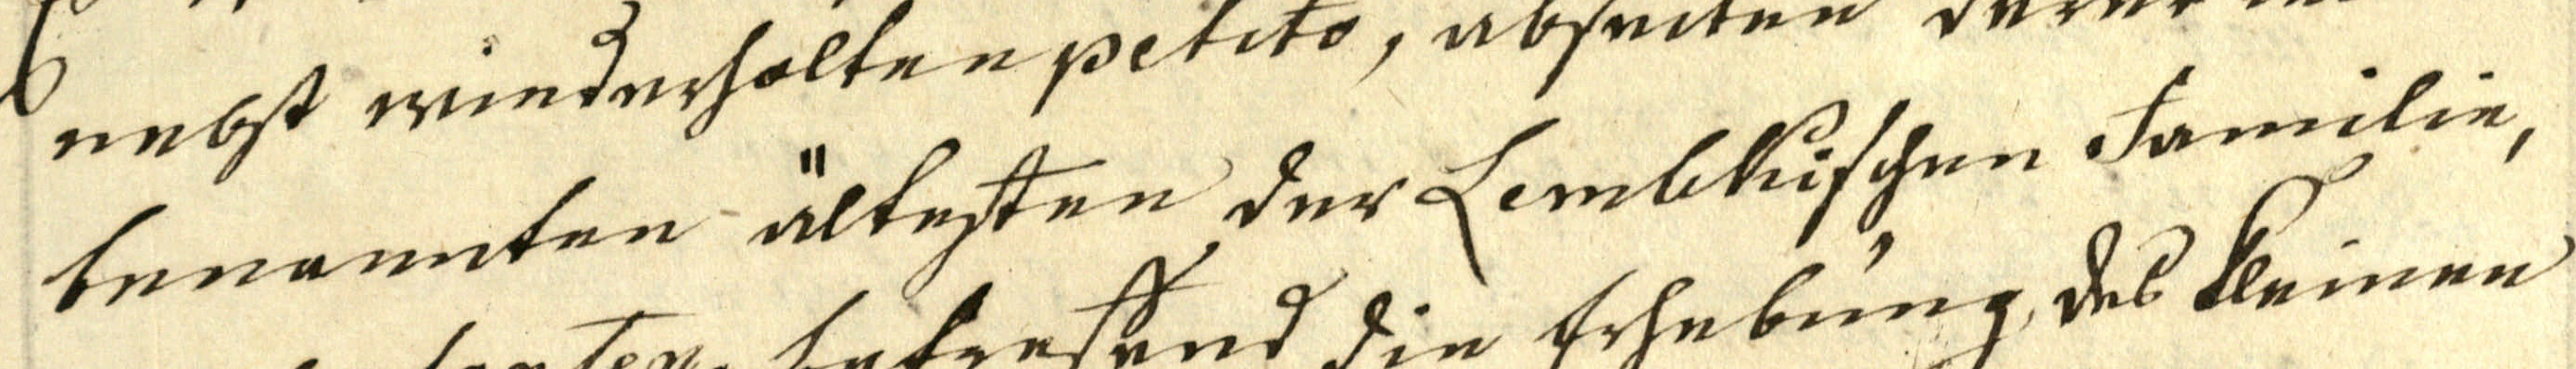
benannten ältesten der Lembkischen Familie,
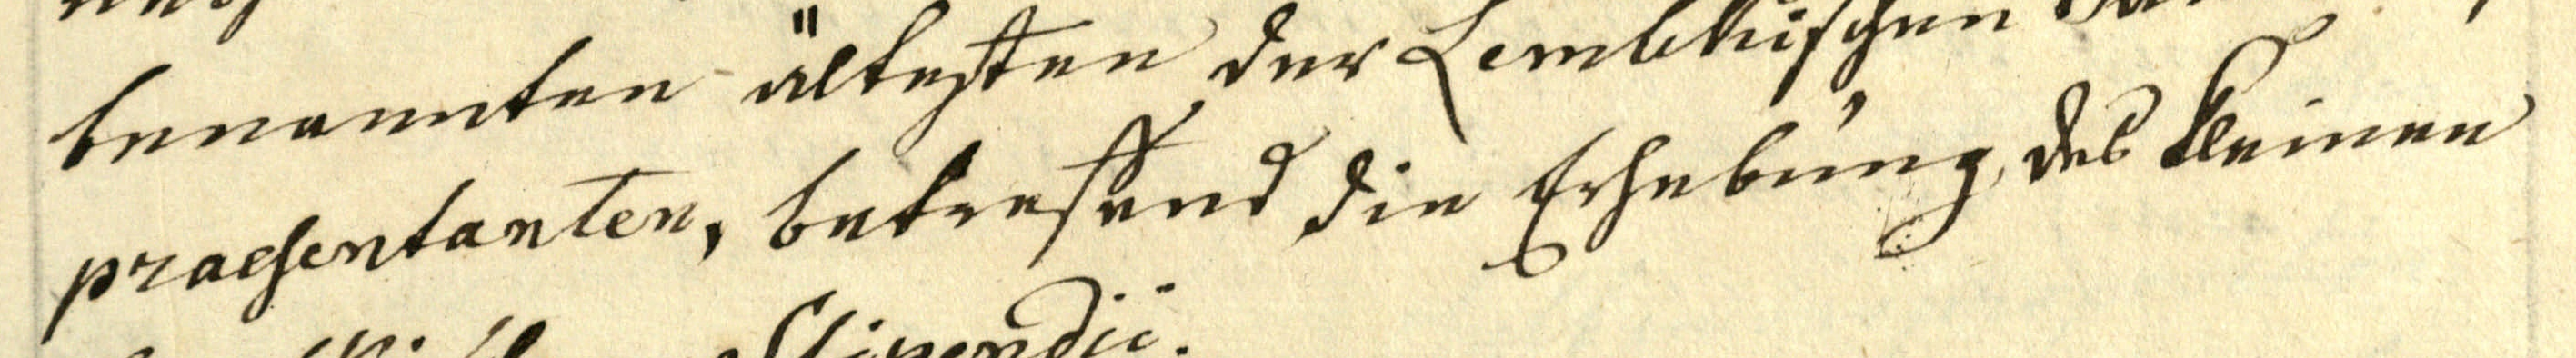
praesentanten, betreffend die Erhebung des kleinen
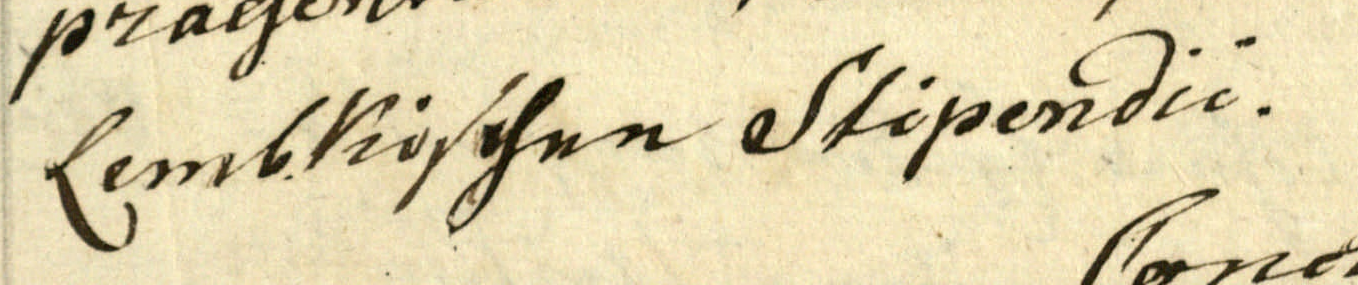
Lembkischen Stipendii.
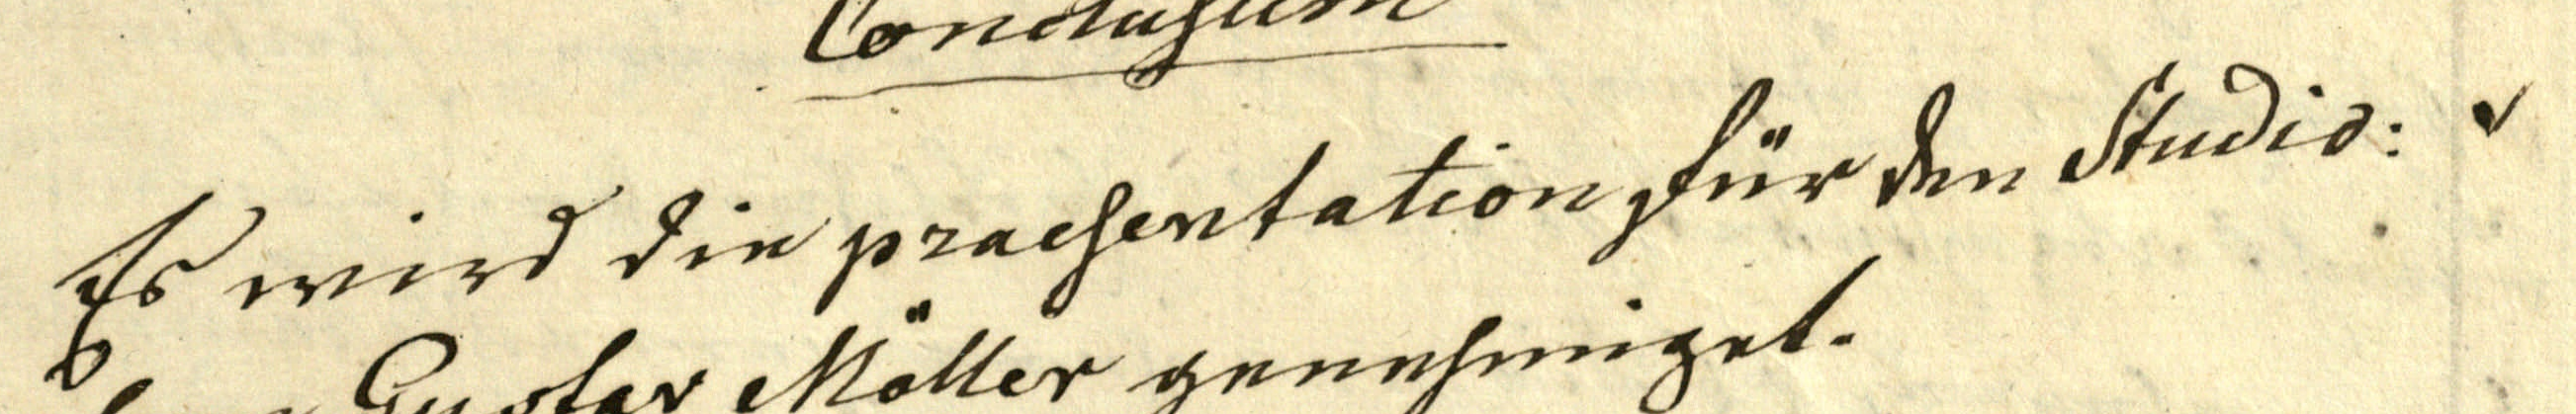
Es wird die praesentation für den Studio¬
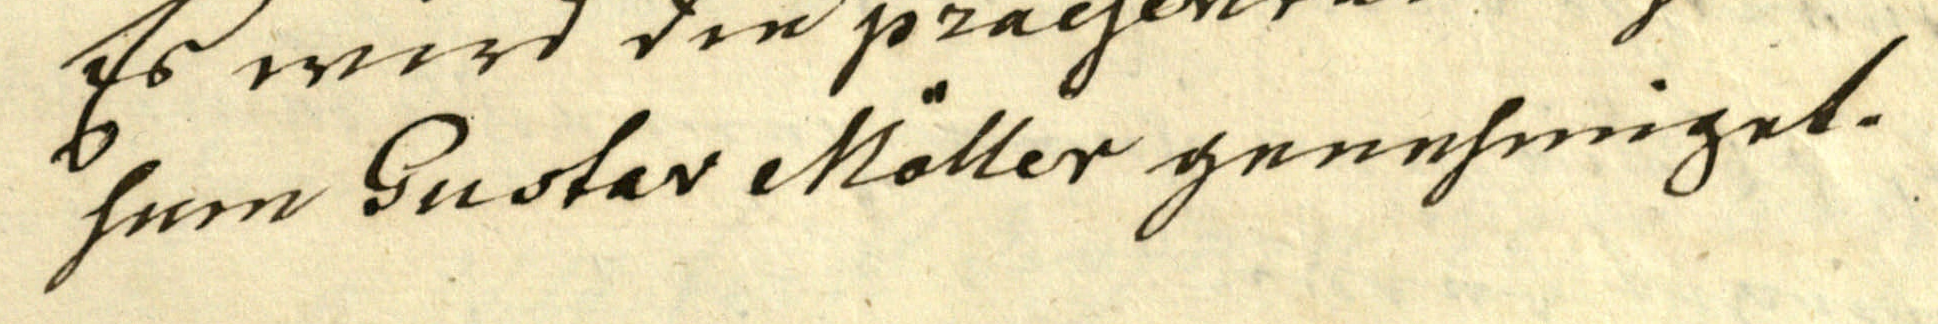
sum Gustav Möller genehmiget.
